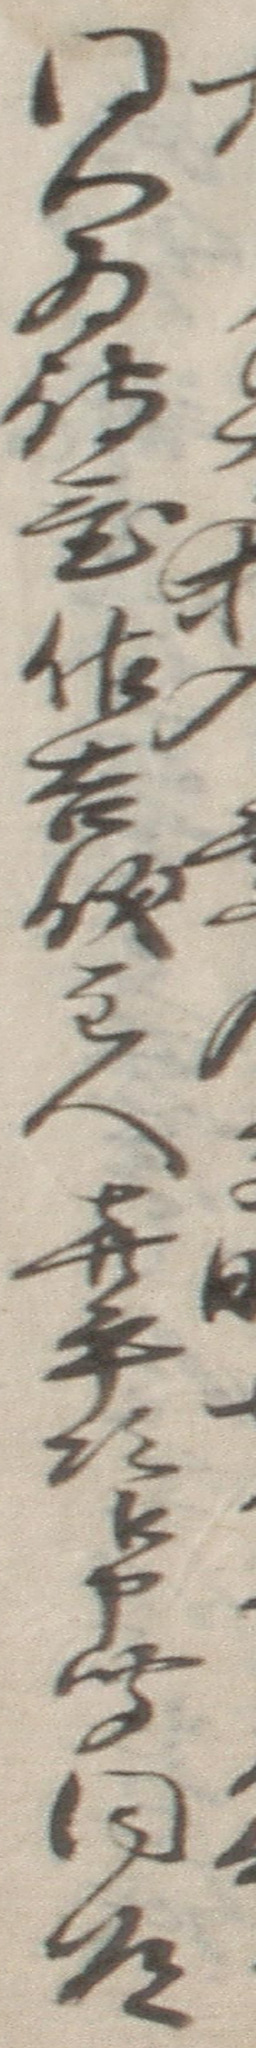同人為待置佐吉儀主人喜平次江申聞同道

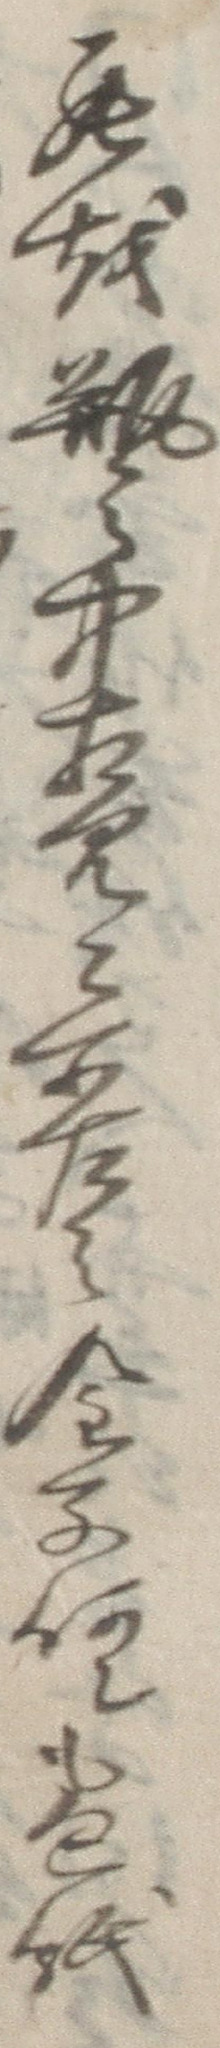罷越瓶之中相見候所左之金子何ㇾも包紙
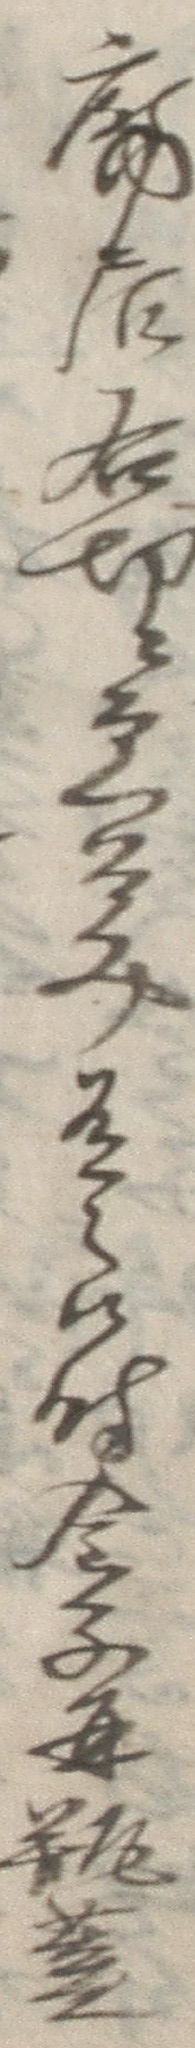腐居右切二而くるみ有之候二付金子并瓶蓋
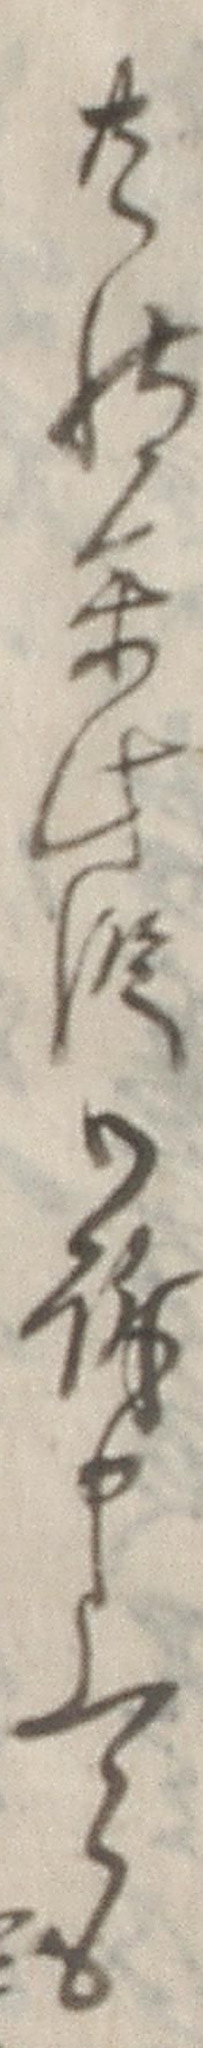共持参此段御訴申上候以上
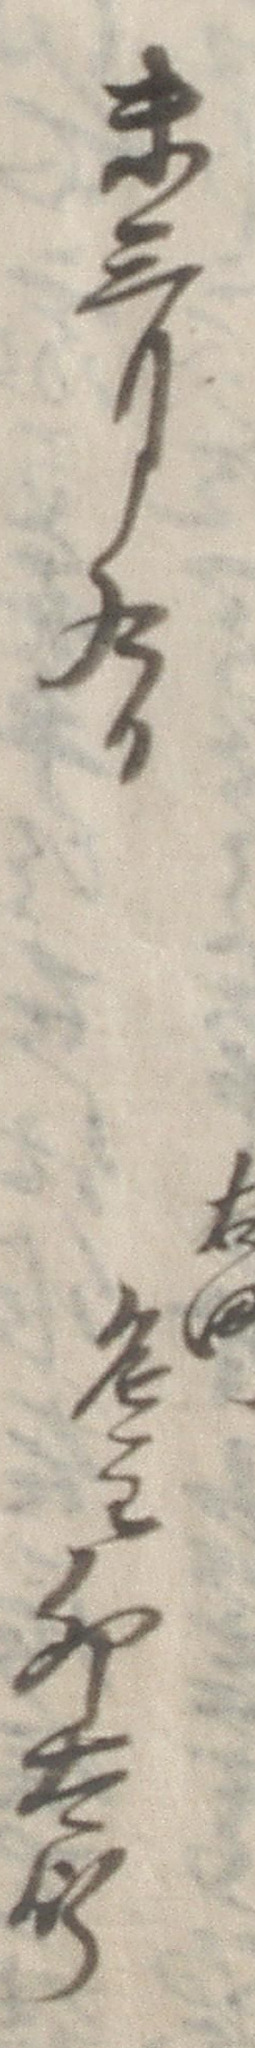未三月九日名主卯太郎
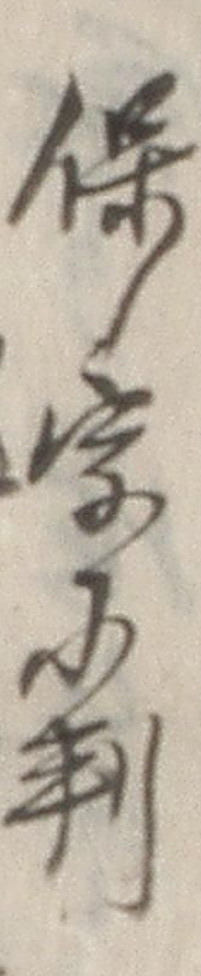保字小判
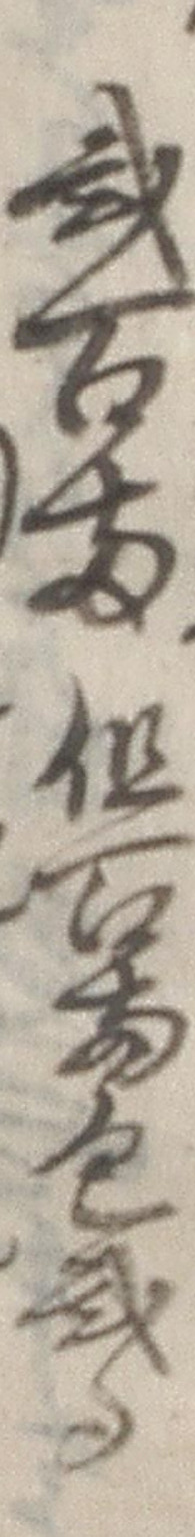弐百両但百両包弐ッ
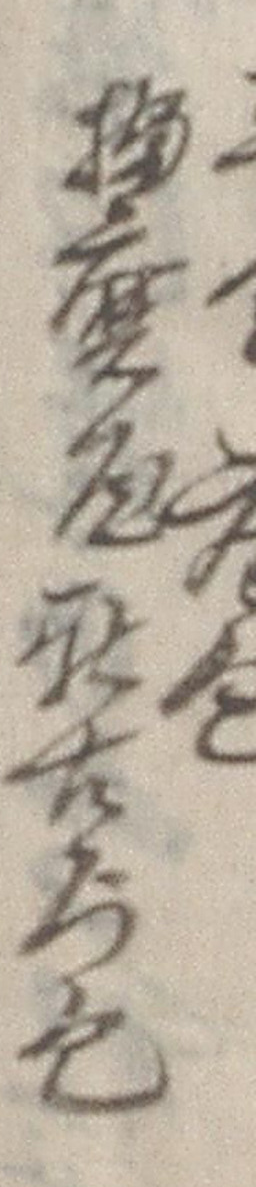掏慶屋新右衛門包
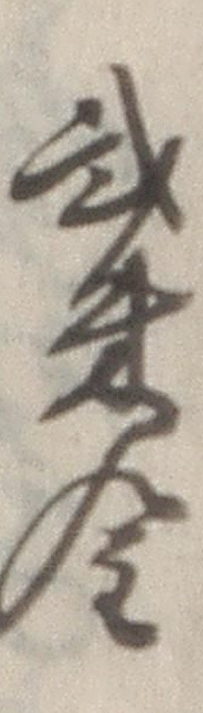弐朱金
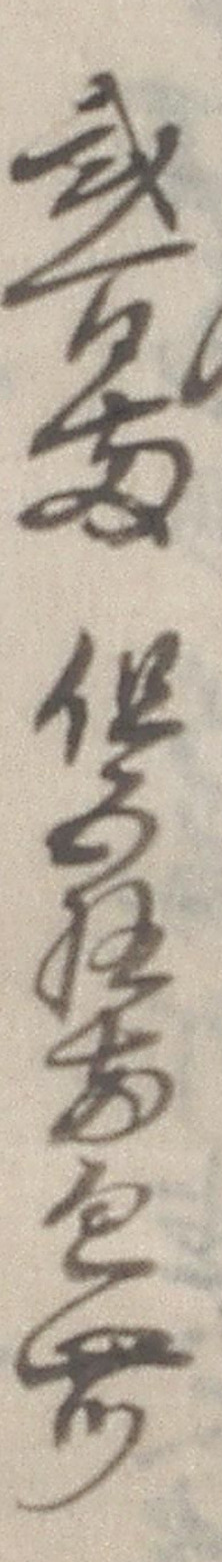弐百両但五拾両包四ッ
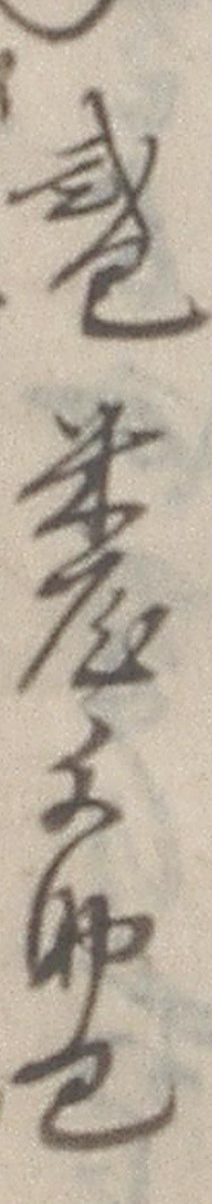内弐包米屋千助包
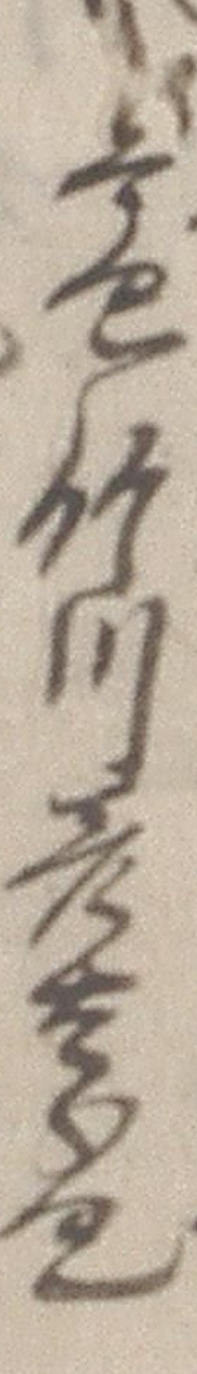壱包竹川彦太郎包
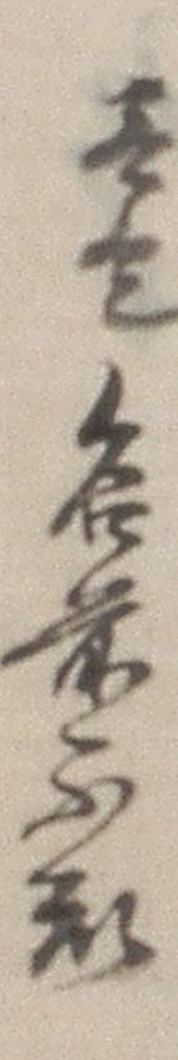壱包名前不知
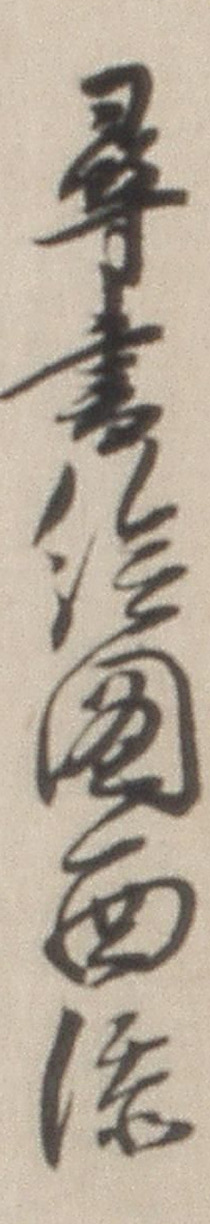尋書絵図面添
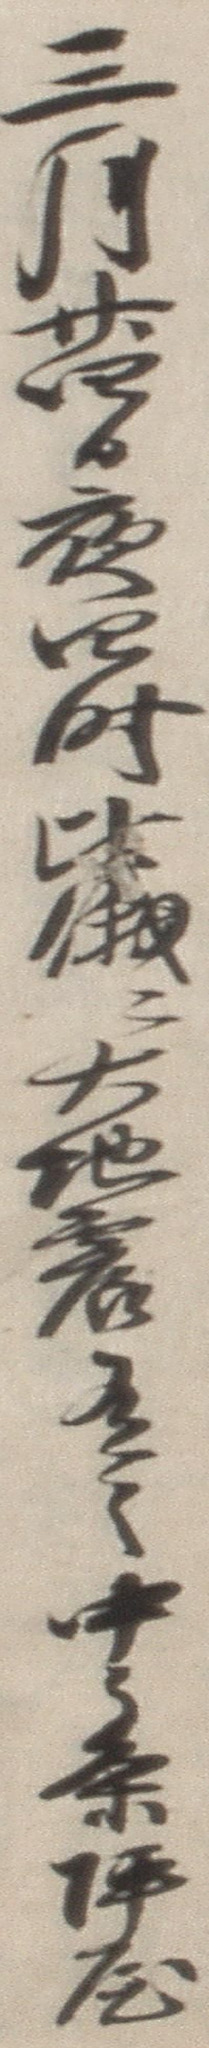三月廿四日夜四時比俄二大地震有之中之条陣屋
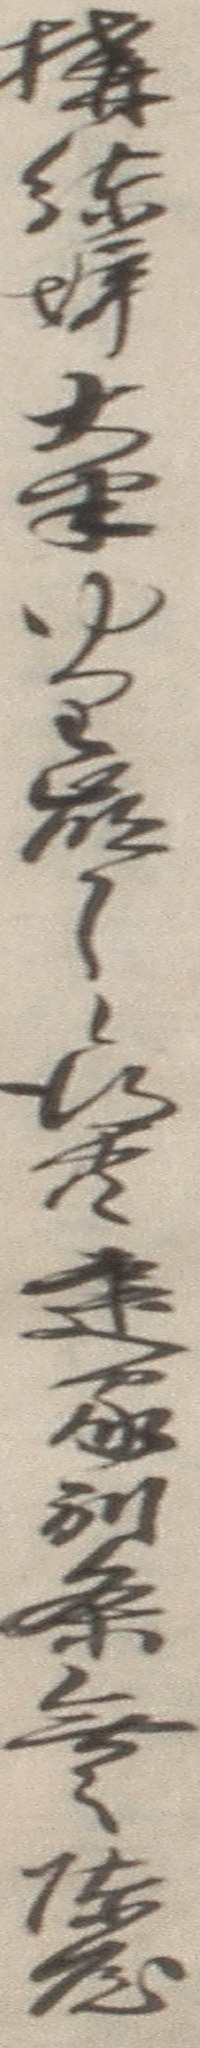構練塀大半ゆり崩し候得共建家別条無之陣屋
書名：信州地震一件
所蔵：東京大学地震研究所図書室 Earthquake Research Institute Library, The University of Tokyo, JAPAN
